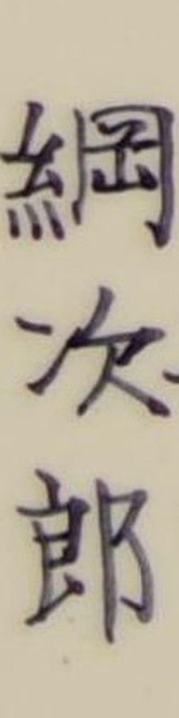綱次郎

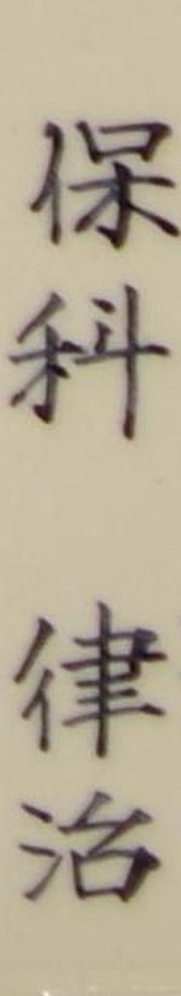保科律治
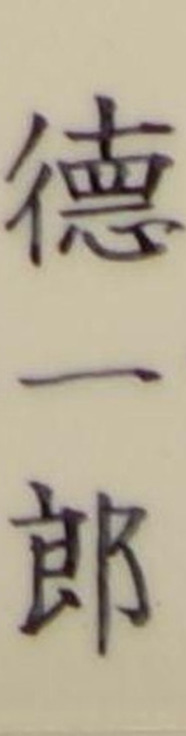徳一郎
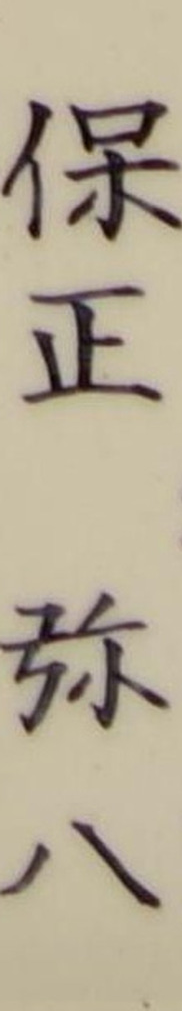保正弥八
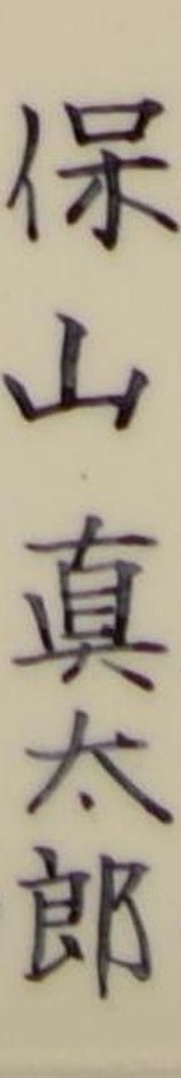保山真太郎
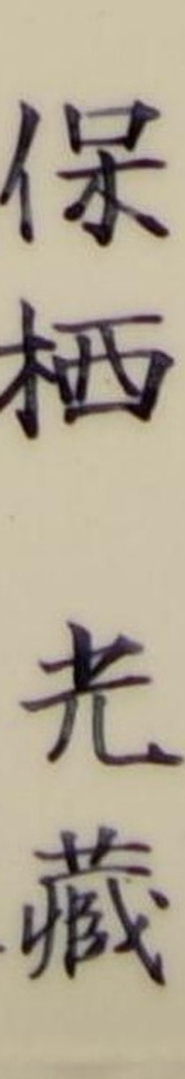保栖光蔵
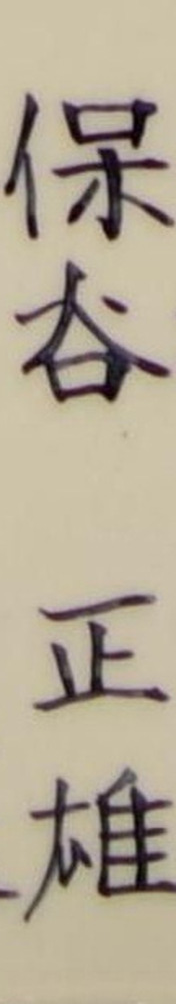保谷正雄
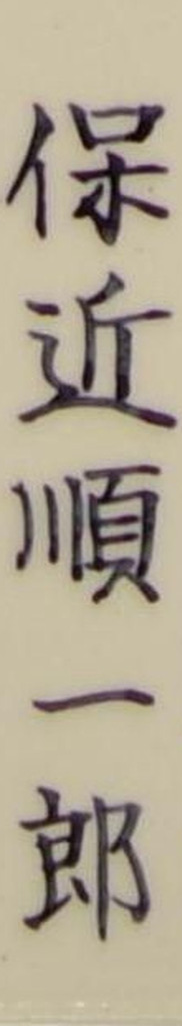保近順一郎
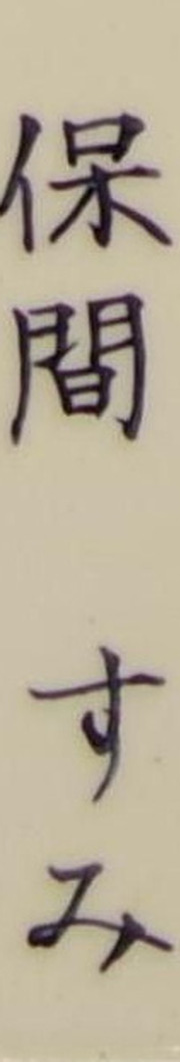保間すみ
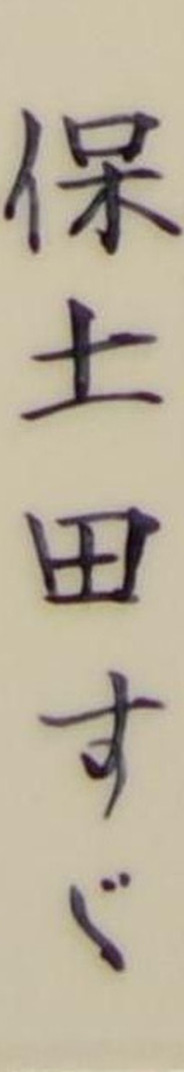保土田すず
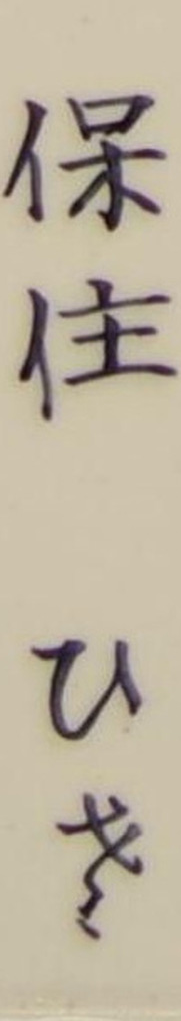保住ひさ

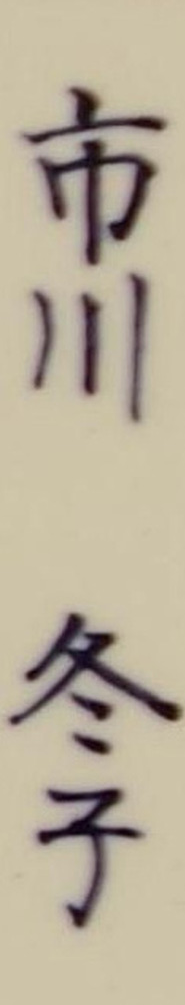市川冬子
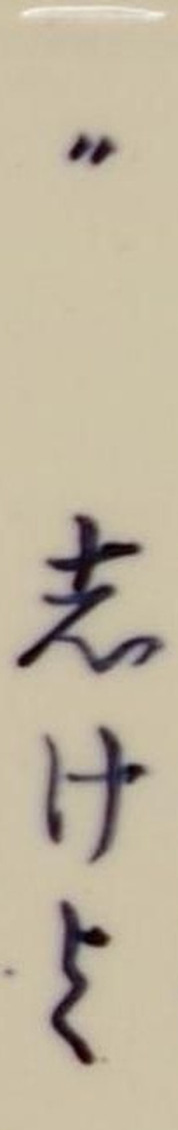しけと
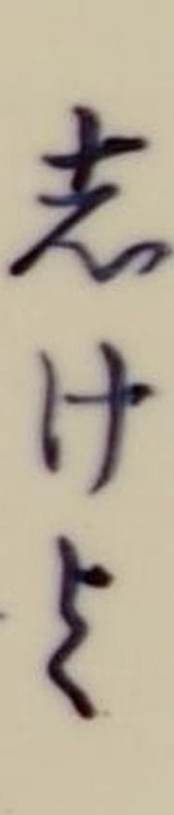しけと
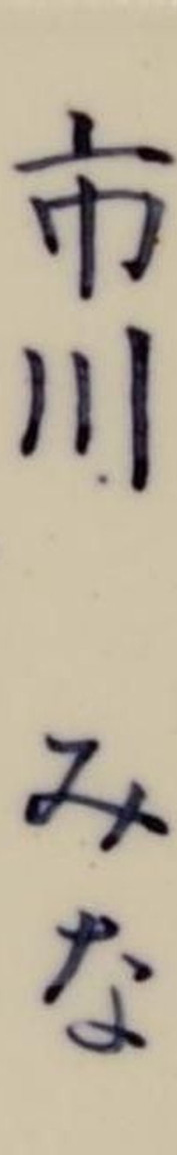市川みな
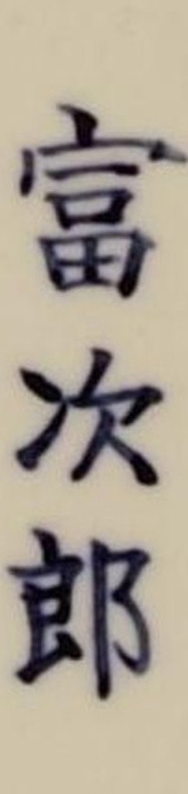富次郎
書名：A~D
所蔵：koyasan kongobuji
